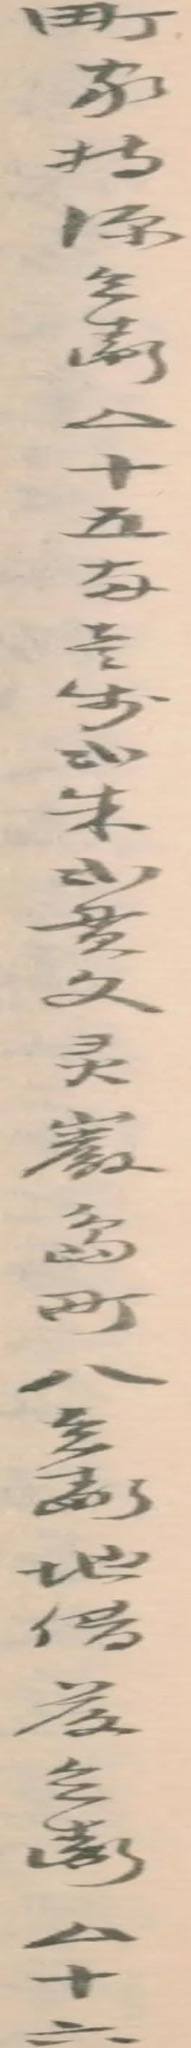町家持源兵衛△十五両壱歩弐朱弐貫文霊巖島町八兵衛地借藤兵衛△十六
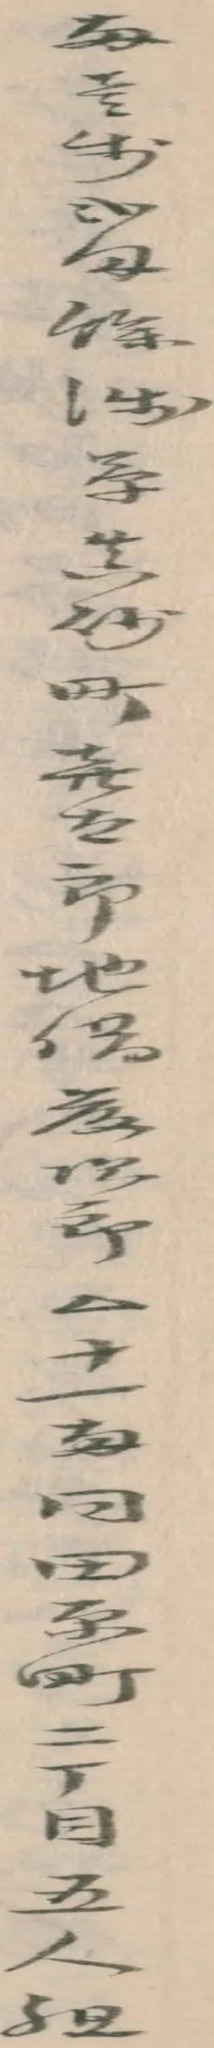両壱歩弐匁余浅草真砂町喜太郎地借藤次郎△十一両同田原町二丁目五人組
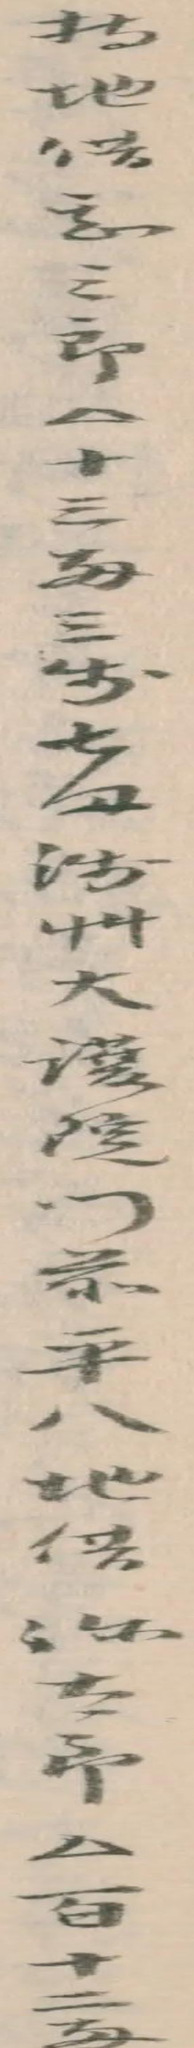持地借甚三郎△十三両三歩七匁浅草大護院門前平八地借弥太郎△百十二両
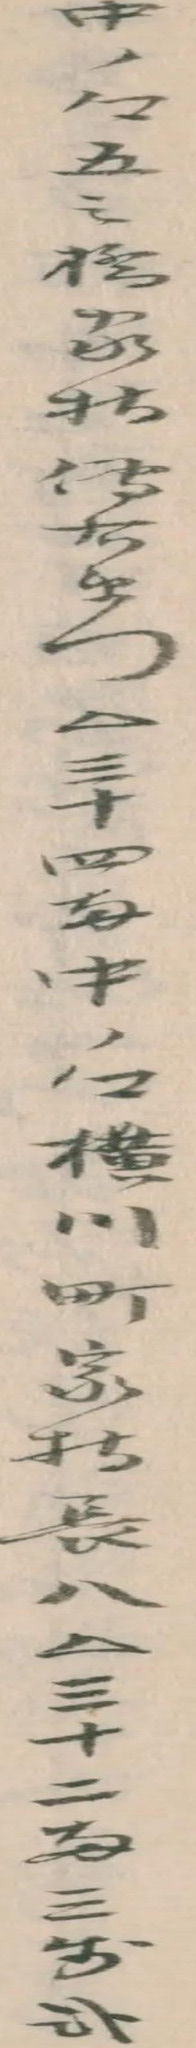中ノ郷五之橋家持伝右衛門△三十四両中ノ郷横川町家持長八△三十二両三歩弐
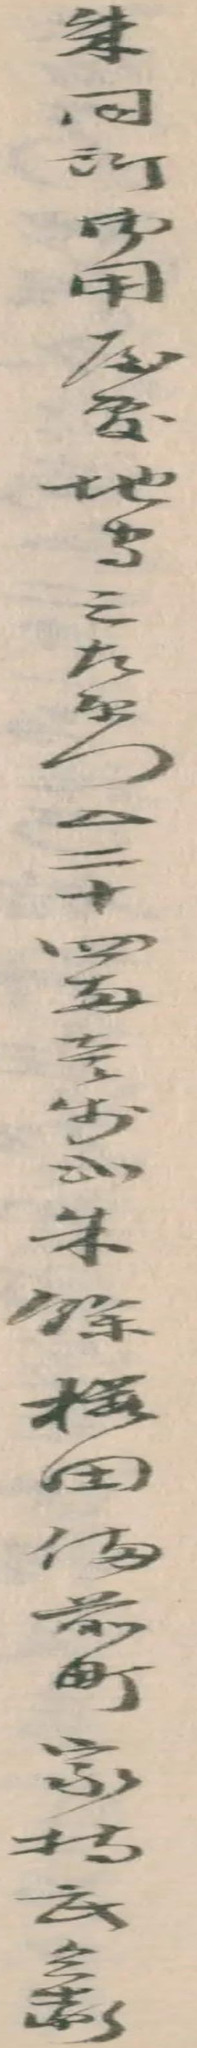朱同所御用屋敷地守三左衛門△二十四両壱歩弐朱余桜田備前町家持武兵衛
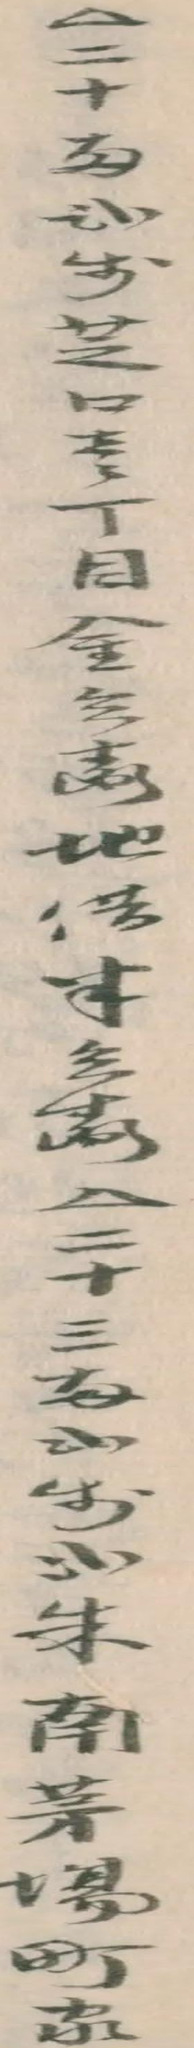△二十両弐歩芝口壱丁目金兵衛地借半兵衛△二十三両弐歩弐朱南茅場町家
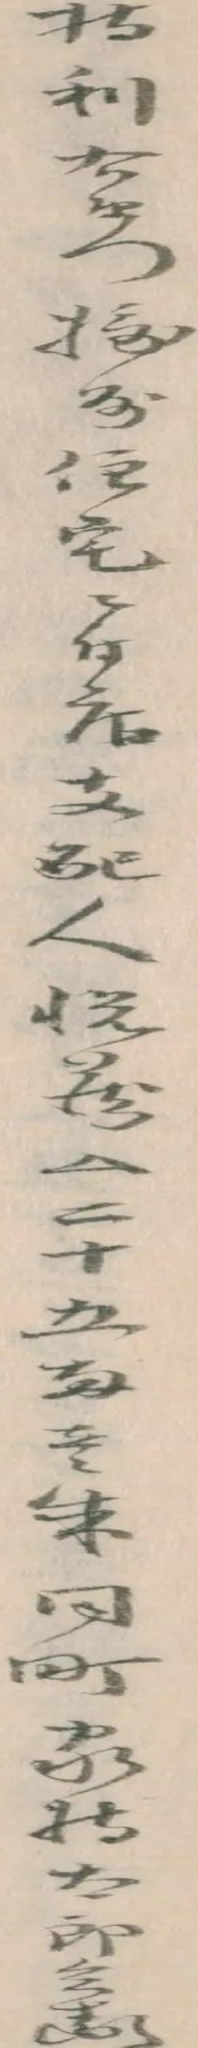持利右衛門摂州住宅付店支配人悦蔵△二十五両壱朱同町家持太郎兵衛
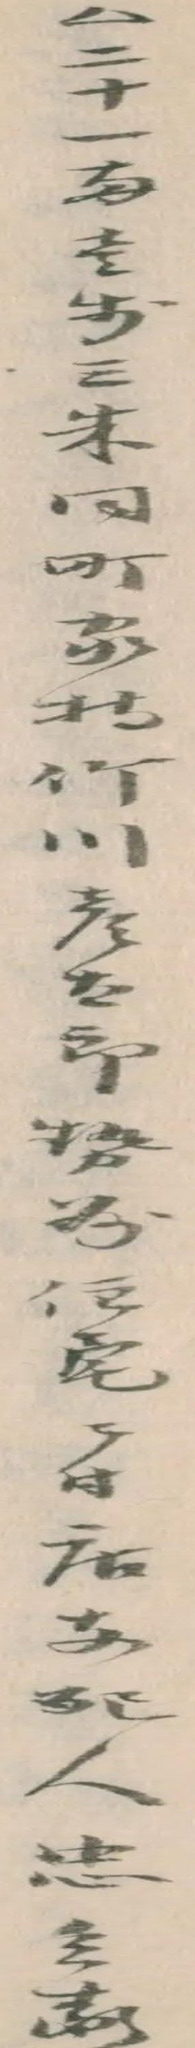△二十一両壱歩三朱同町家持竹川彦太郎勢州住宅付店支配人忠兵衛
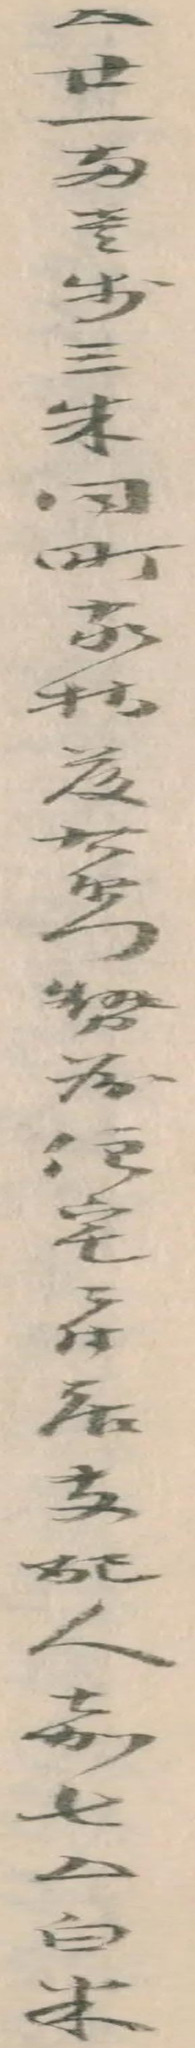△廿一両壱歩三朱同町家持藤右衛門勢州住宅付店支配人嘉七△白米
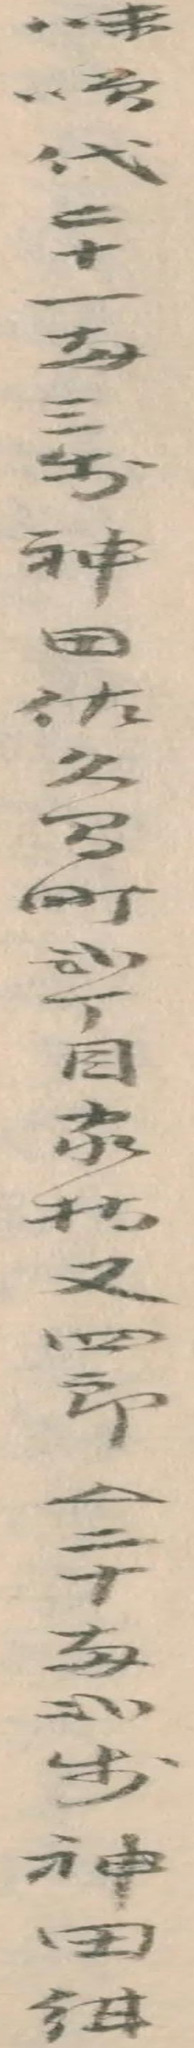味噌代二十一両三歩神田佐久間町弐丁目家持又四郎△二十両弐歩神田紺

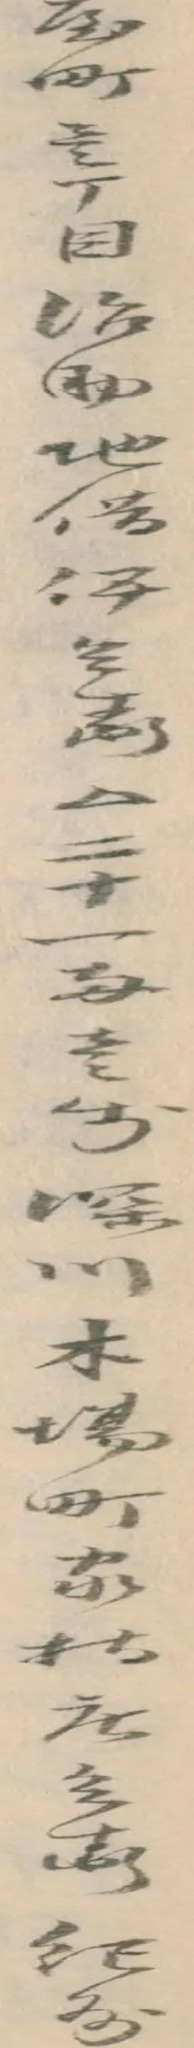屋町壱丁目治助地借伊兵衛△二十一両壱歩深川木場町家持庄兵衛紀州
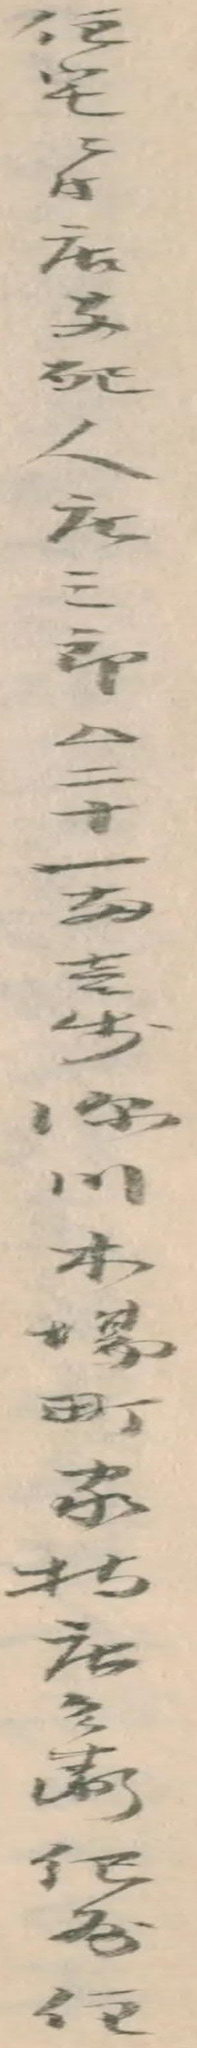住宅付店支配人庄三郎△二十一両壱歩深川木場町家持庄兵衛紀州住
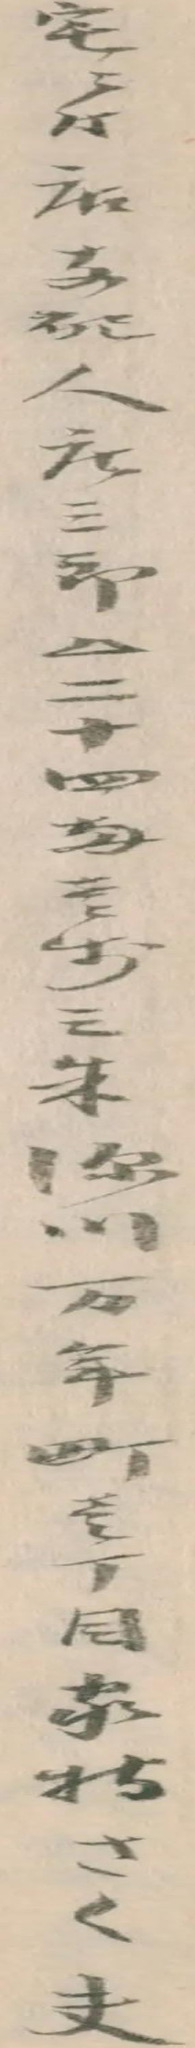宅付店支配人庄三郎△二十四両壱歩三朱深川万年町壱丁目家持さく夫
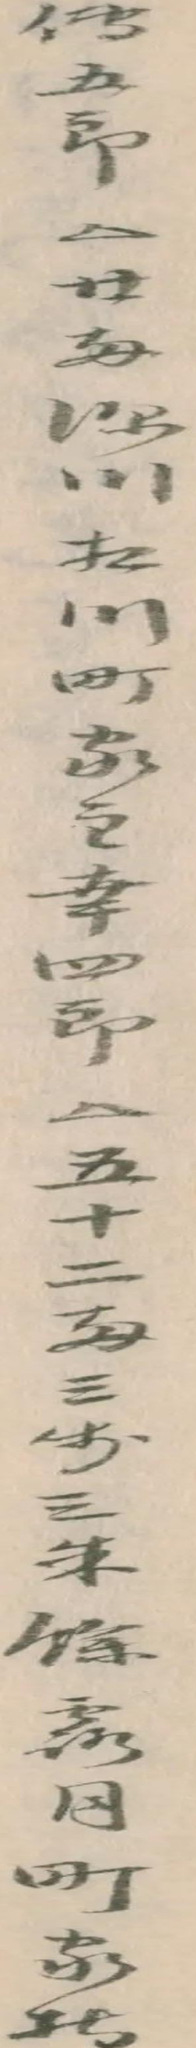伝五郎△廿両深川相川町家主幸四郎△五十二両三歩三朱余露月町家持
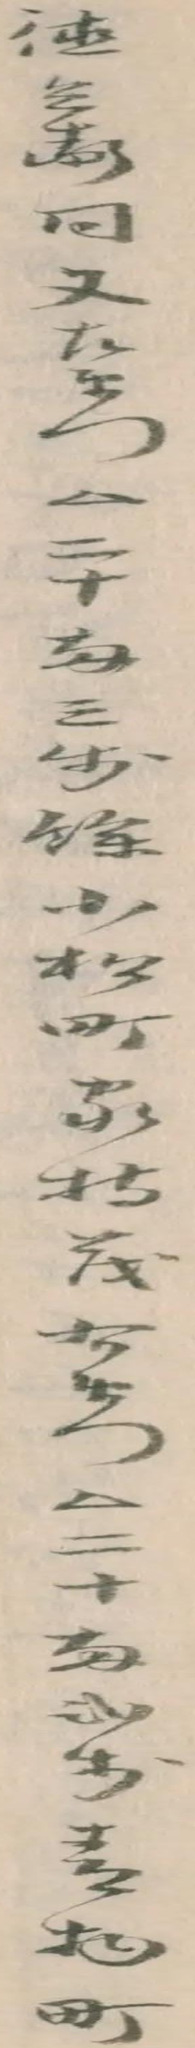徳兵衛同又左衛門△二十両三歩余小松町家持茂右衛門△二十両弐歩青物町
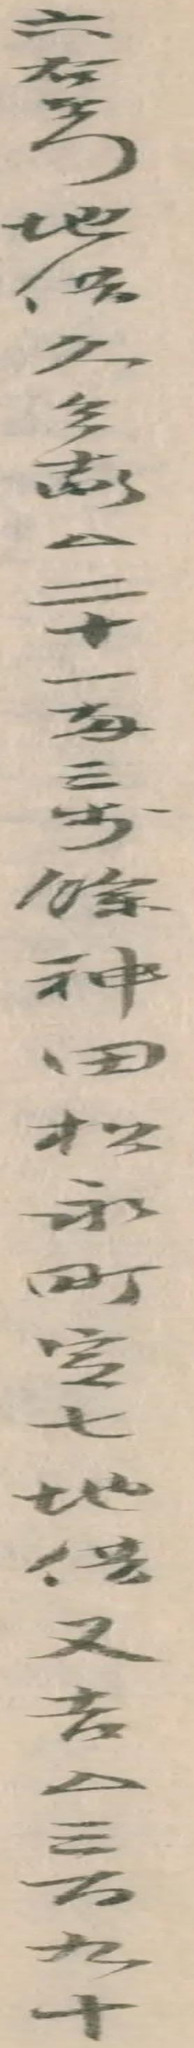六右衛門地借久兵衛△二十一両三歩余神田松永町定七地借又吉△三百九十
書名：地災撮要. 巻10(地震之部) 上,下
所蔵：国立国会図書館 National Diet Library, JAPAN
